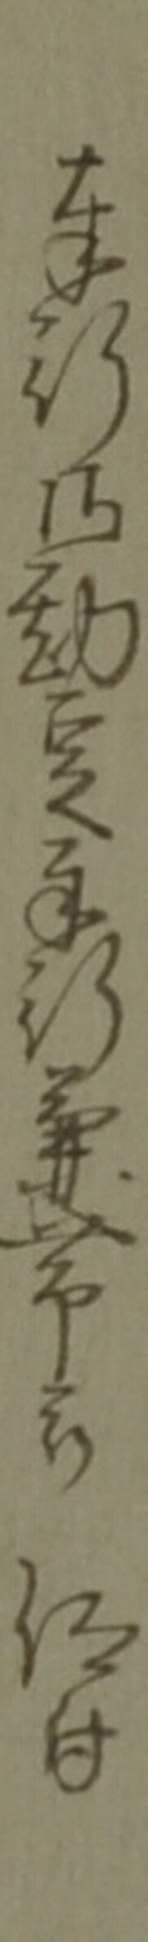奉行御勘定奉行兼帯被仰付
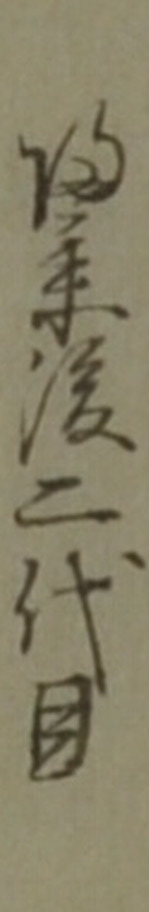帰参後二代目
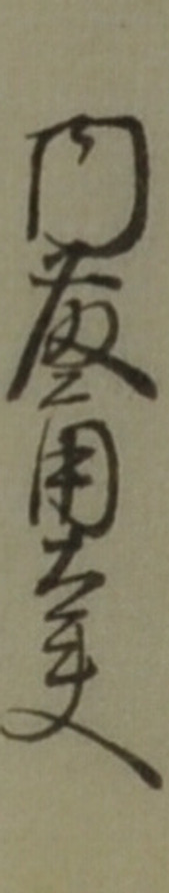内藤角太夫
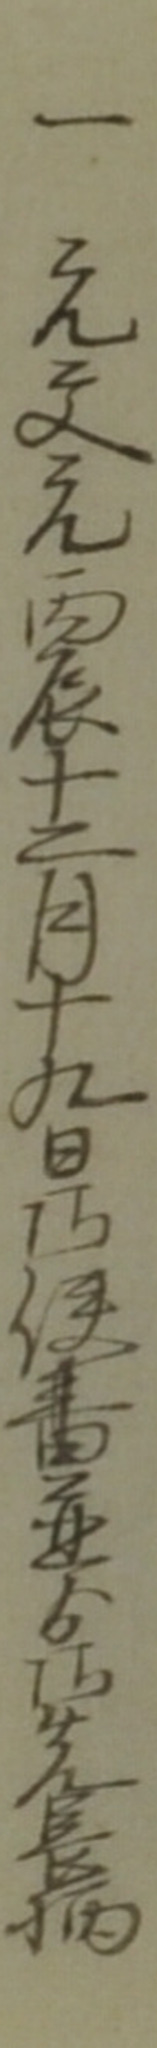一元文元丙辰十二月十九日御使番並ゟ御先長柄
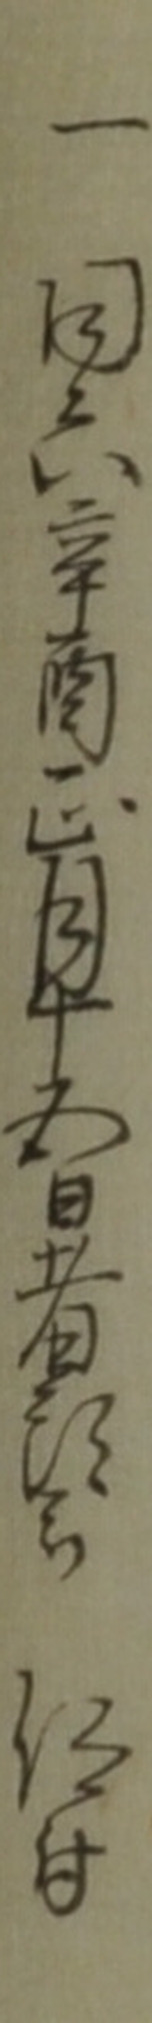一同六辛酉正月十五日者頭被仰付
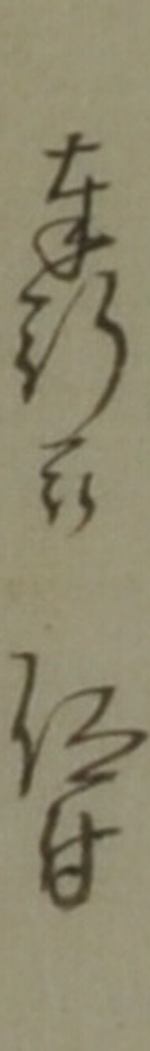奉行被仰付
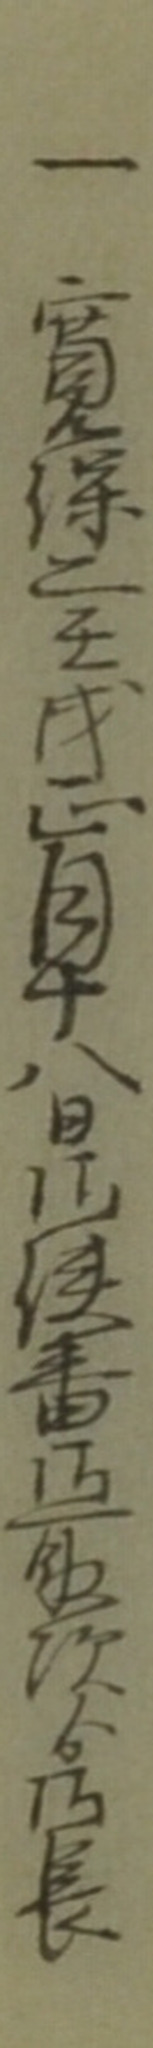一寛保二壬戌正月十八日御使番御取次ゟ御長
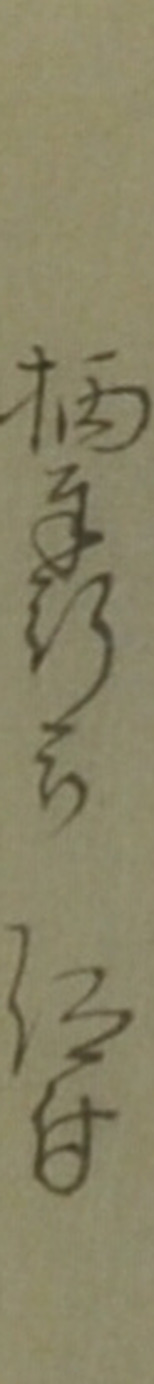柄奉行被仰付
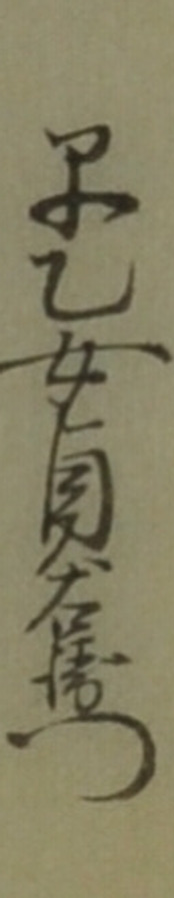早乙女貞右衛門
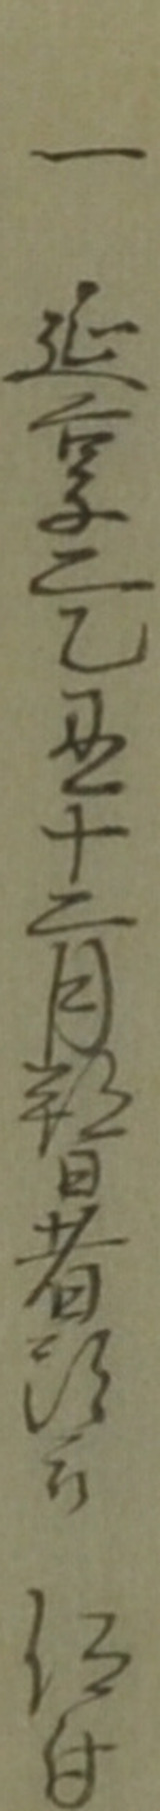一延享二乙丑十二月朔日者頭役被仰付
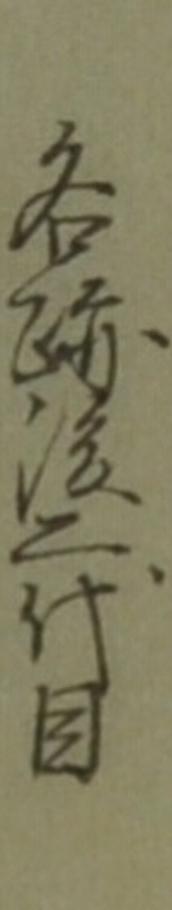名跡後二代目
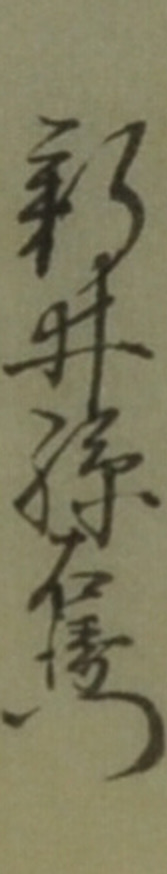新井孫右衛門
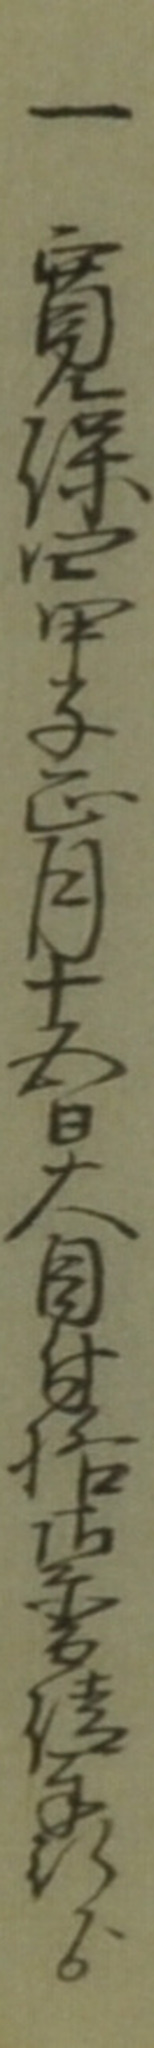一寛保四甲子正月十五日大目付格御普請奉行ゟ
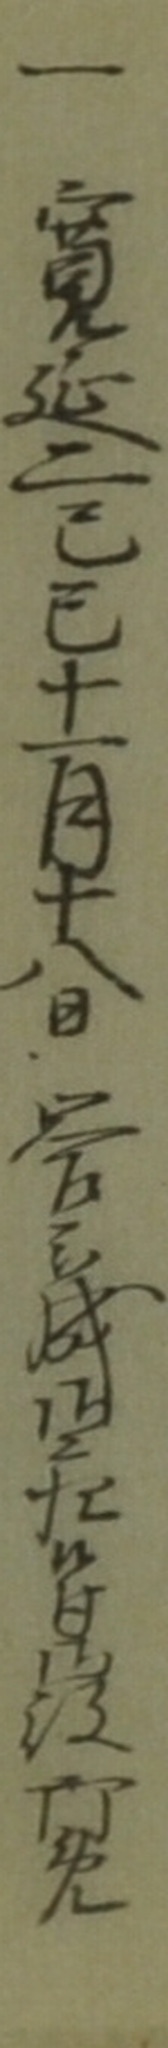一寛延二己巳十一月十八日思召被成御座候付御役御免
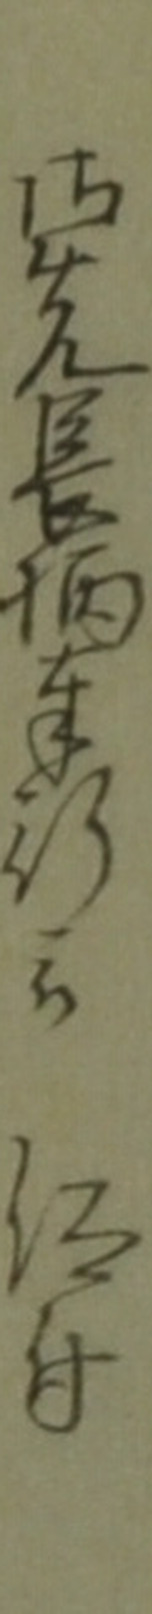御先長柄奉行被仰付
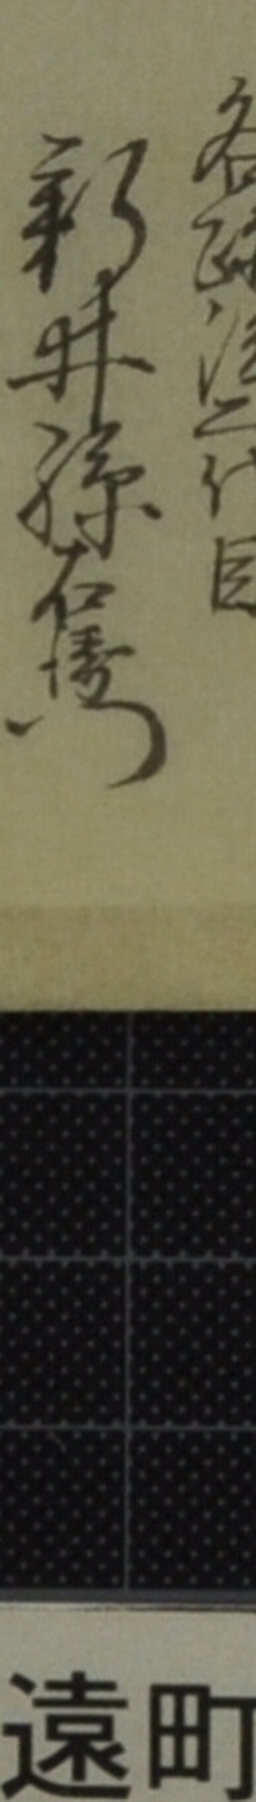新井孫右衛門
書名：諸御役代々録（三）
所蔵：伊那市立高遠町図書館・合同会社AMANE
